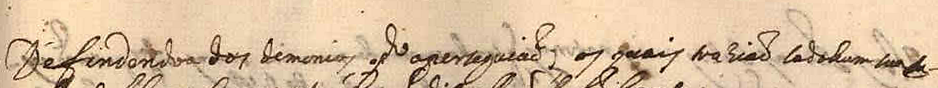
Defendendoa dos demonios, qdo a perseguiaõ, os quais traziaõ cada hum sua ca
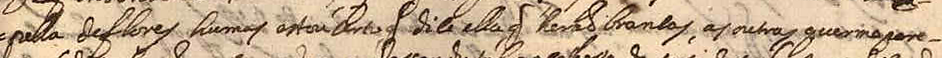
pella de flores, humas estou certo q̄ dice ella q̄ heraõ brancas, as outras querme pare
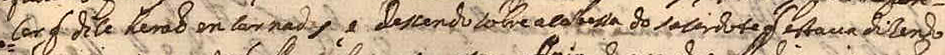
Cer q̄ dice heraõ encarnadas, e descendo sobre a cabessa do sacerdote q̄ estaua dizendo
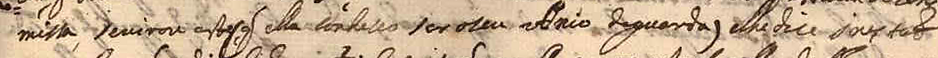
missa se uirou este (q̄ ella conheceo ser o seu Anio de guarda) e lhe dice Ines taõ
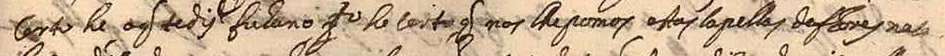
Certo he o q̄ te dis fulano qto he certo q̄ nos lhe pomos estas Capellas de flores na ca
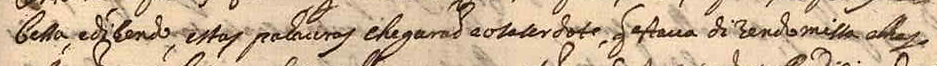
bessa, e dizendo estas palauras chegaraõ ao sacerdote, q̄ estaua dizendo missa e lhas
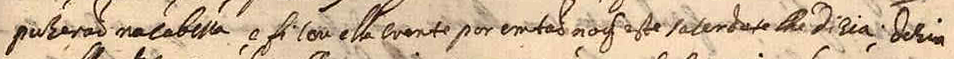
puzeraõ na cabessa, e ficou ella crente por entaõ no q̄ este sacerdote lhe dizia, dezia
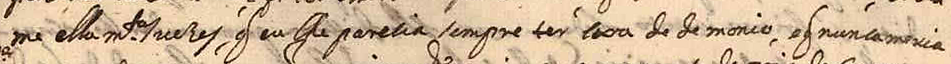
me ella m.tas uezes q̄ eu lhe parecia sempre ter cara de demonio, e q̄ nunca me uia
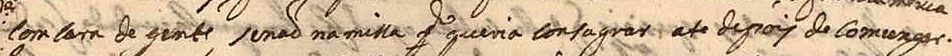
com cara de gente senaõ na missa qdo queria consagrar ate depois de Comungar
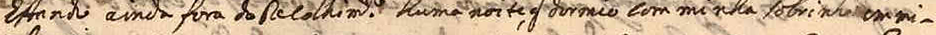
Estando ainda fora do Recolhim.to huma noite, q̄ dormio com minha sobrinha em mi
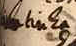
la tinha
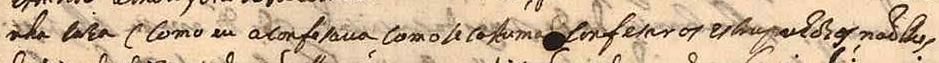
nha caza (Como eu a confesaua como se costuma confesar os Escrupulozos, naõ lhes
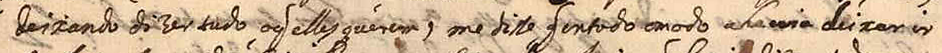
deixando dizer tudo o q̄ elles querem) me disse q̄ en todo o modo a hauia deixar ir
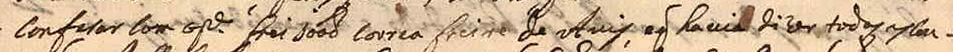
confesar com o p.e frei Ioaõ Correa freire de Auis, e q̄ hauia dizer todas as cou
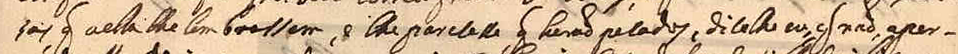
sas q̄ a ella lhe lembrassem, e lhe parecesse q̄ heraõ pecados, dicelho eu, q̄ naõ aper
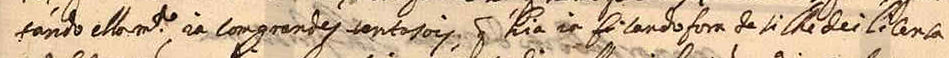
tando ella m.to ia com grandes tentasois, q̄ hia ia ficando fora de si lhe dei licensa
